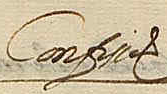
Confissão
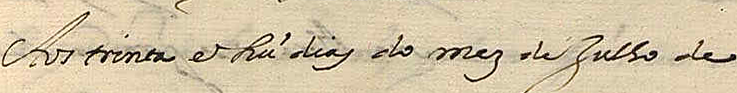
Aos trinta e hū dias do mez de Julho de
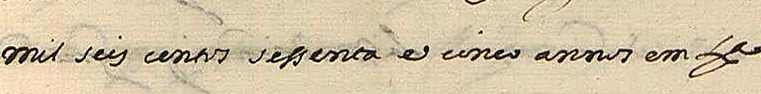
mil seiscentos sessenta e cinco annos em Lxa
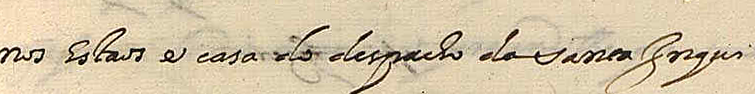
nos Estaos e casa do despacho da Santa Jnqui
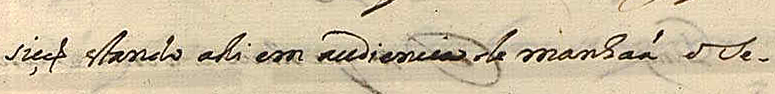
siçaõ estando ahi em audiencia de manhaā o Se
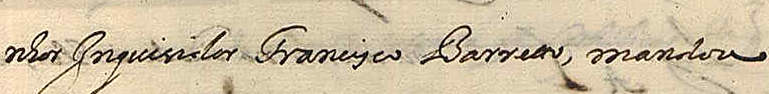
nhor Jnquisidor Francisco Barreto, mandou
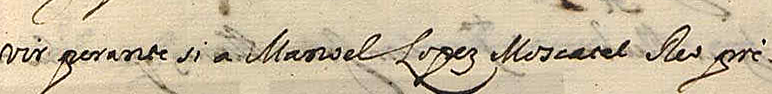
vir perante si a Manoel Lopez Moscatel Reo pre
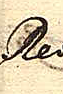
Reo
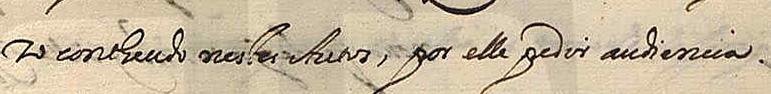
zo contheudo nestes Autos, por elle pedir audiencia.
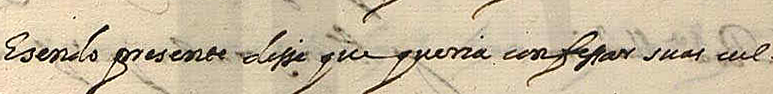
E sendo presente disse que queria confessar suas cul
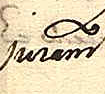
juramto
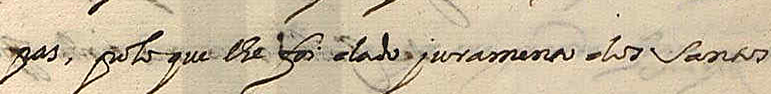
pas, polo que lhe foi dado juramento dos Santos
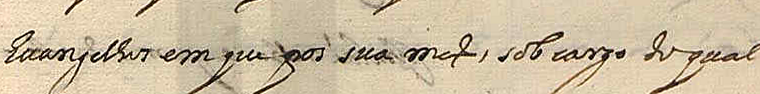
Euangelhos em que pos sua maõ, sob cargo do qual
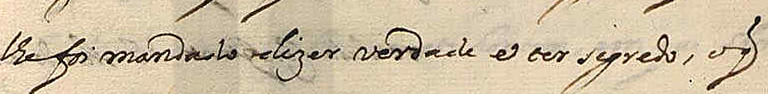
lhe foi mandado dizer verdade e ter segredo, o q̄
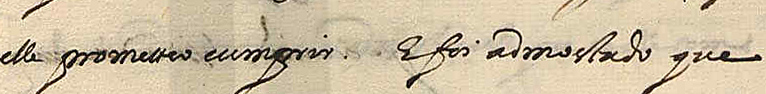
elle prometteo cumprir E foi admoestado que
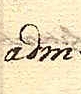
adm.
